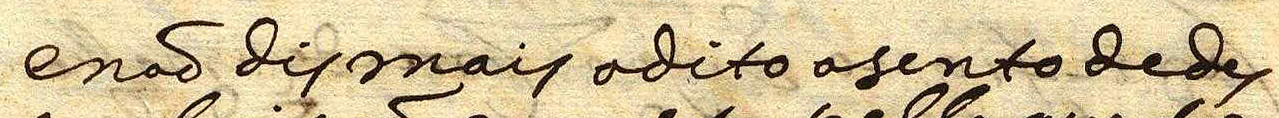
e naõ dis mais o dito asento de des
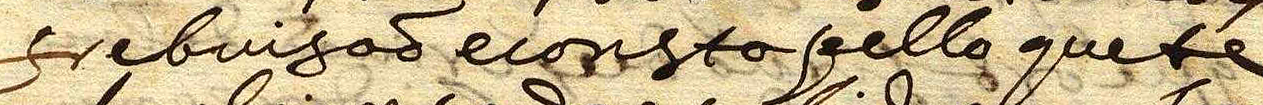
trebuisaõ e consta pello que te
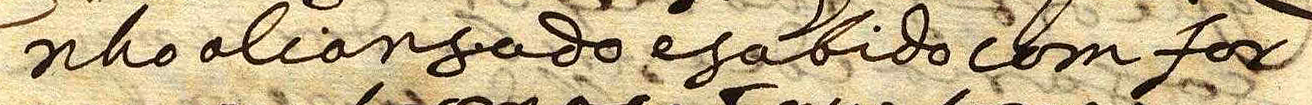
nho alcansado e sabido comfor
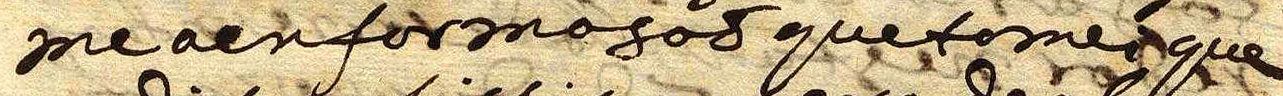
me a enformasaõ que tomei que
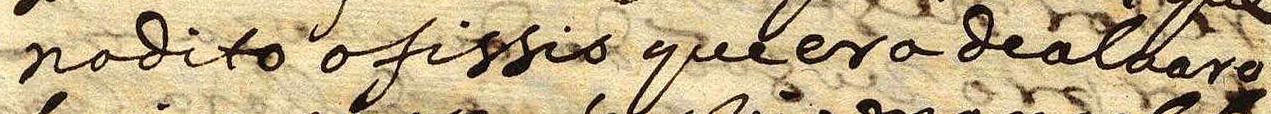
no dito ofissio que era de aluaro
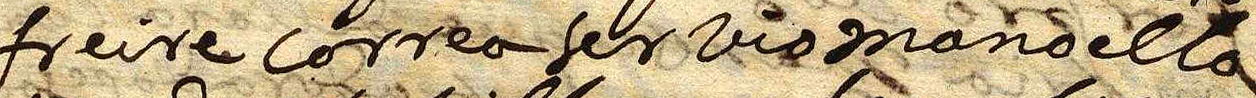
freire correa servio manoel lo
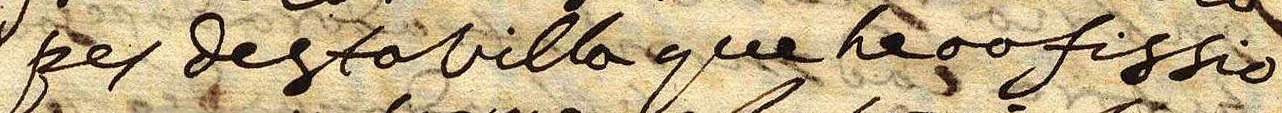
pes desta villa que he o ofissio
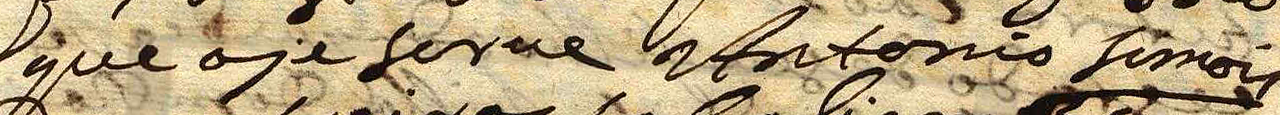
que oje serue Antonio simois
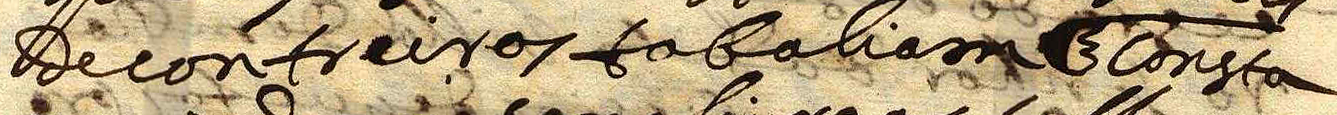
de contreiras tabaliam ⁋ consta
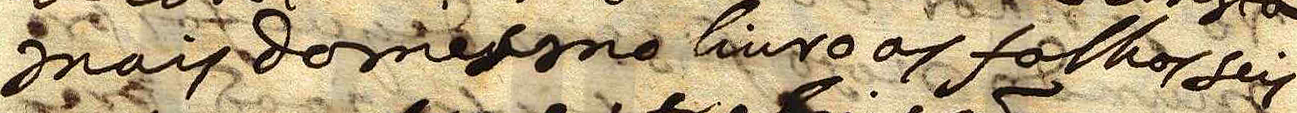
mais do mesmo liuro as folhas seis
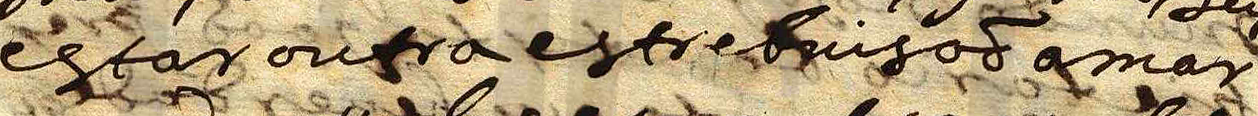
estar outra estrebuisaõ a mar
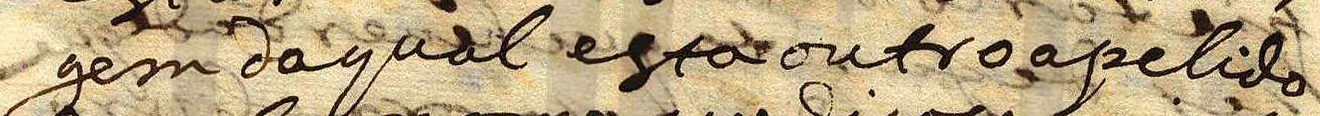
gem da qual esta outro apelido
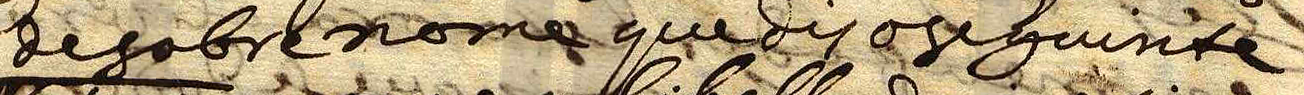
de sobrenome que dis o seguinte
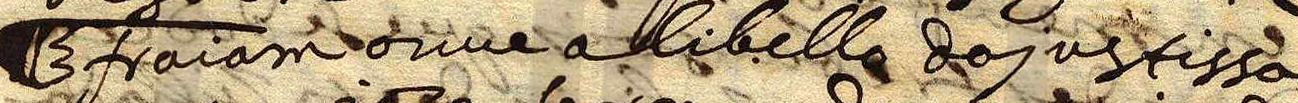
⁋ fraiam ouue o libello da justissa
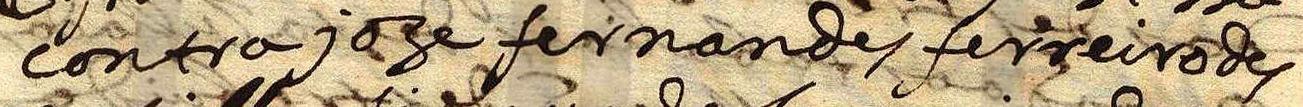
contra joze fernandes ferreiro des
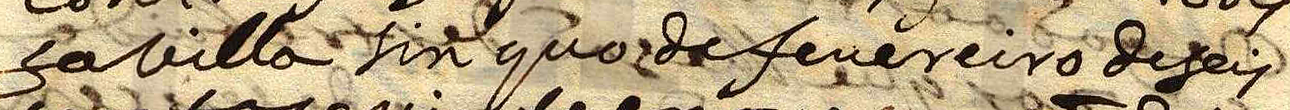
ta villa sinquo de feuereiro de seis
